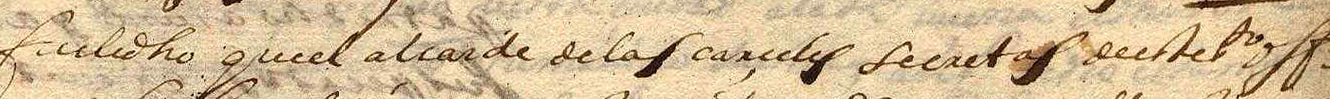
fue le dho que el alcaide de las carceles secretas de este sto offo
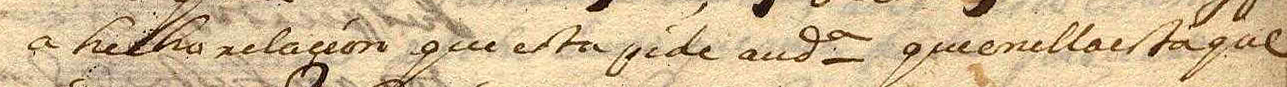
a hecho relacion que esta pide aud.a que en ella esta que
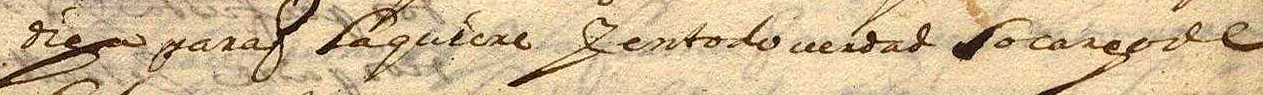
diga para q̄ la quiere y en todo uerdad so carego de
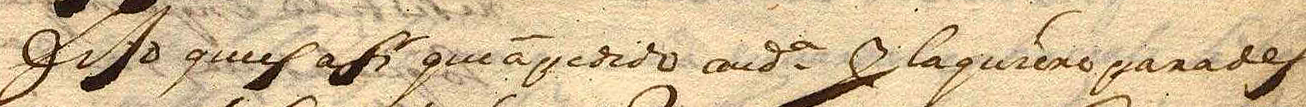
DiJo que es asi que a pedido auda y la quiere para des
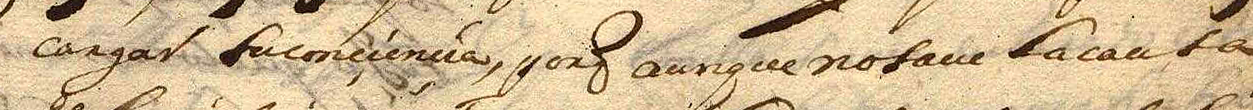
cargar su conciencia, porq̄ aunque no saue la causa
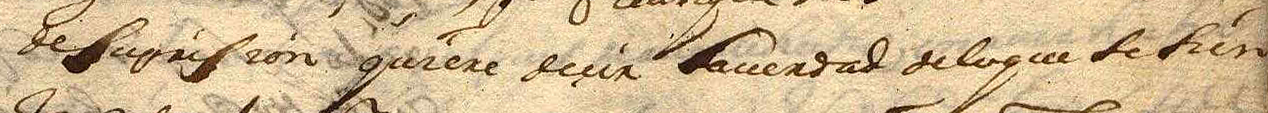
de su prision quiere decir la uerdad de lo que se sien
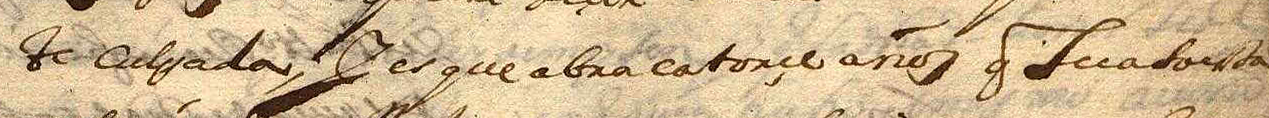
te culpada, y es que abra catorce an̄os q̄ se caso esta
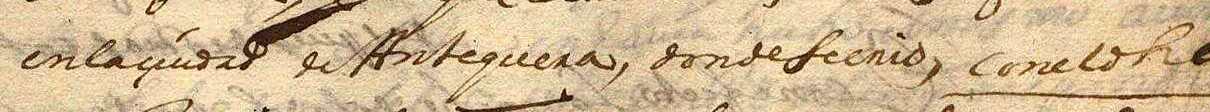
en la ciudad de Antequera, donde se crio, con el dho
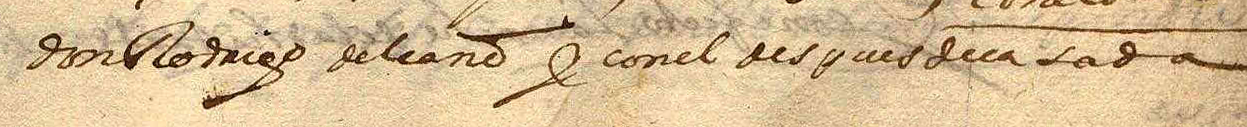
don Rodrigo del can̄o y con el despues de casada
